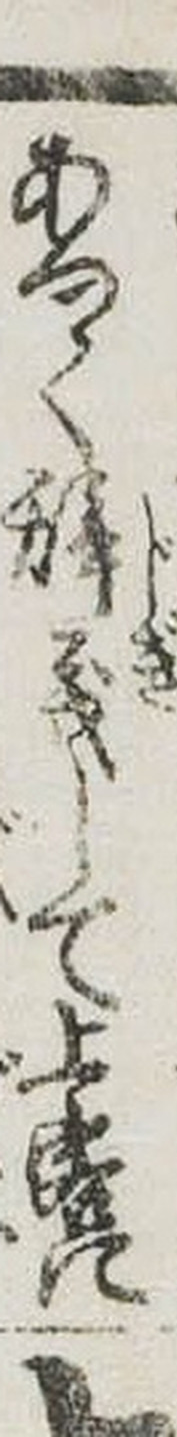あつく辞義して上客に
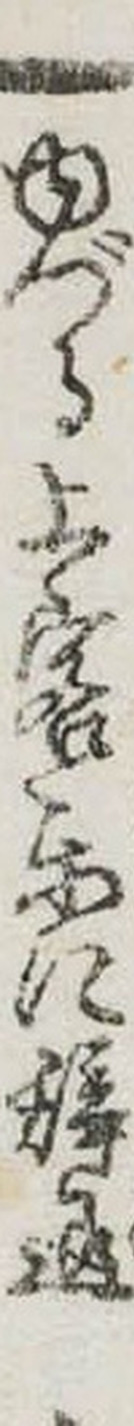ゆづる上客互に辞退
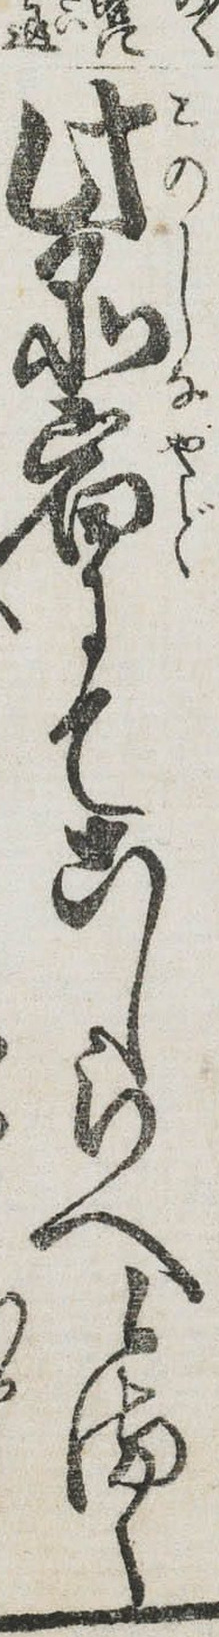此品宿にてこしらへ候まゝ
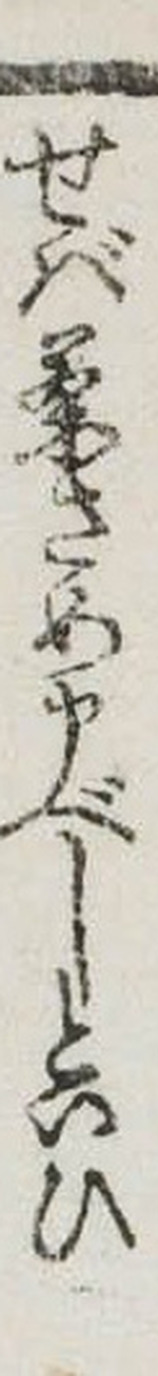せば茶さめ申べしといひ
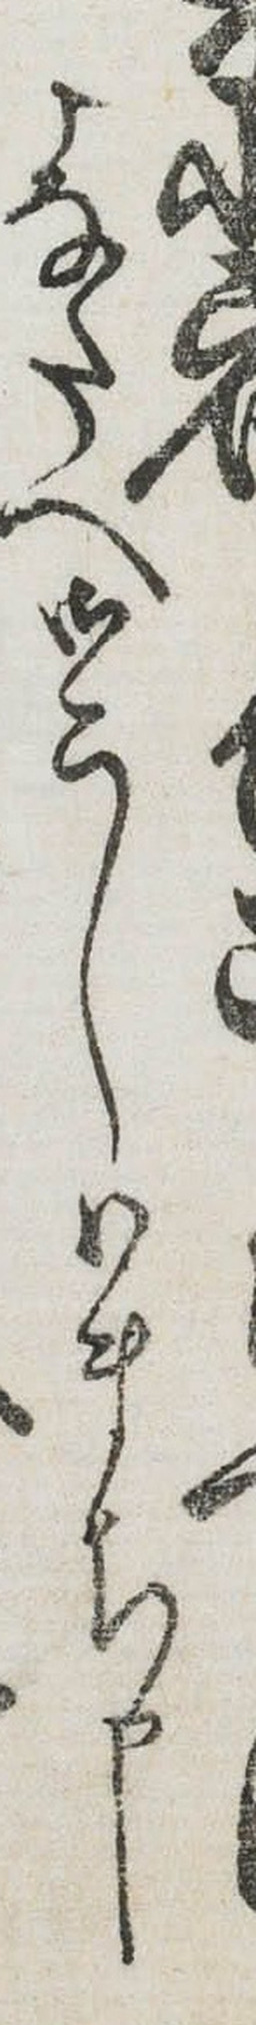こなたへ御こし御まち申
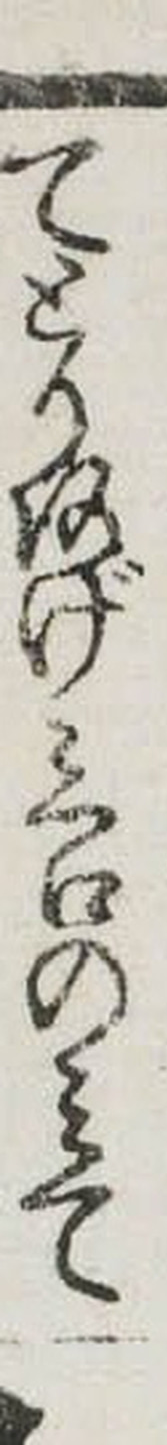てとりあげ三口のみて
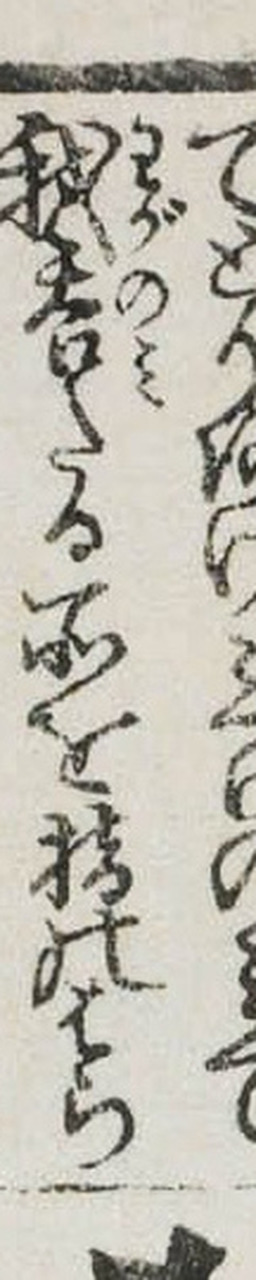我吞たる所を指のはら
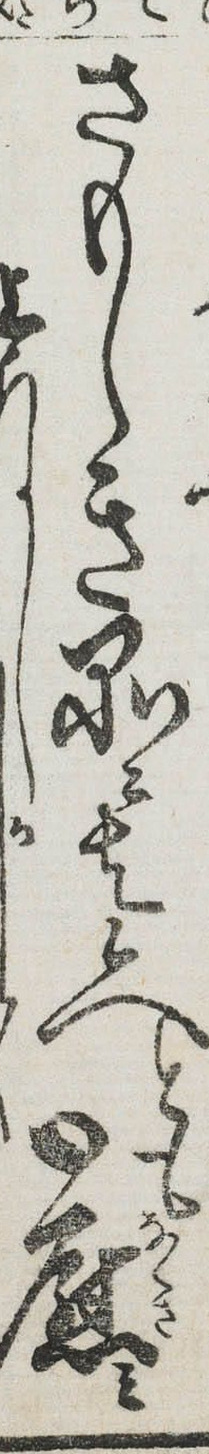さもしき品には候へとも御慰み
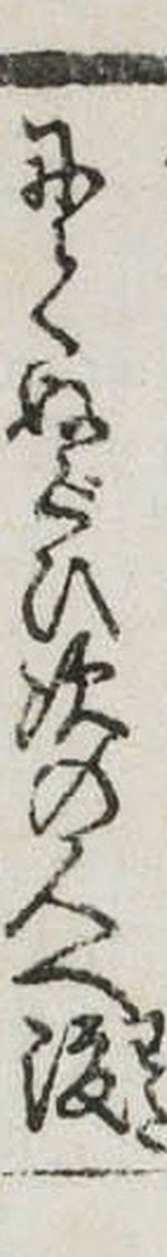にてぬぐひ次の人へ渡
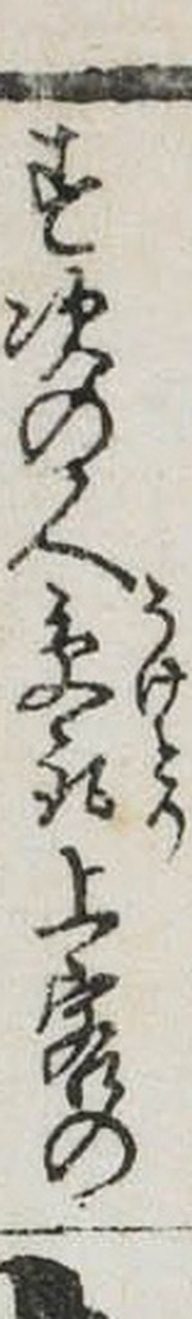す次の人受取上客の
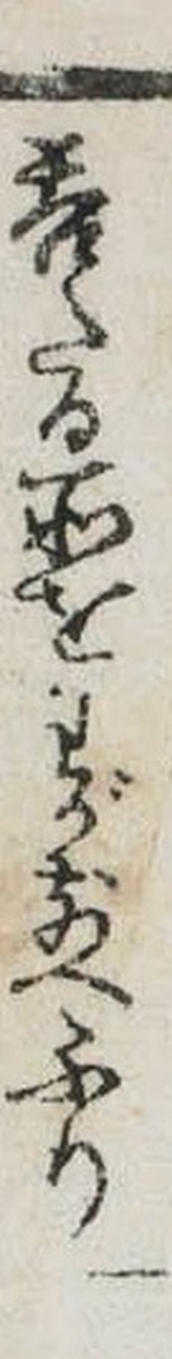呑たる所をわが前へふり
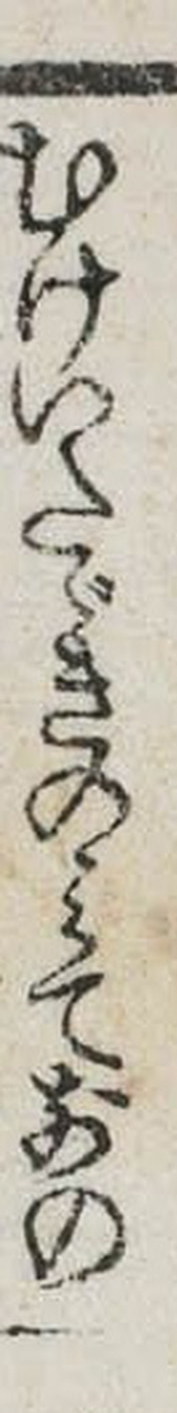むけいたゞきのみて前の
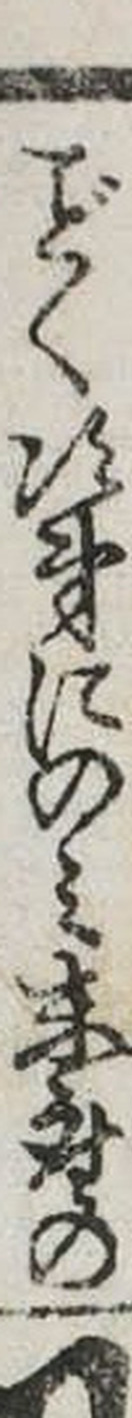ごとく次第にのみ末座の
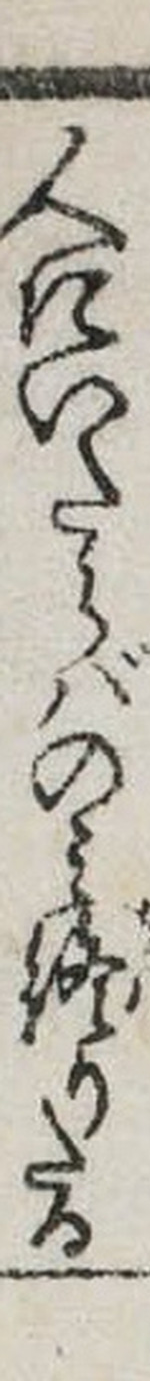人にいたらばのみ終りたる
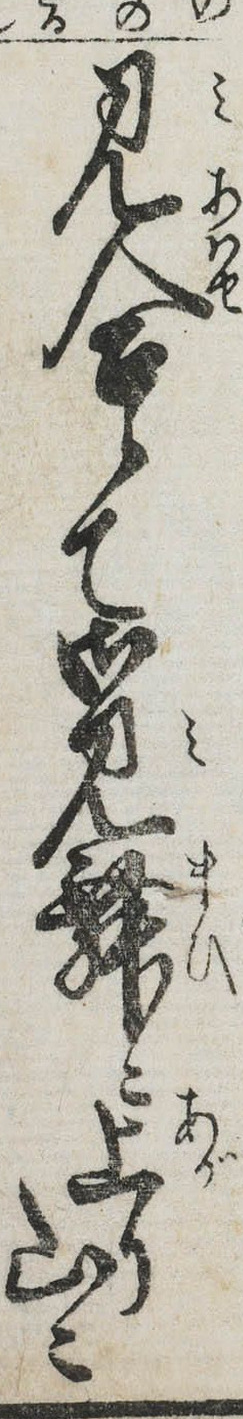見合候て御見舞に上り山々
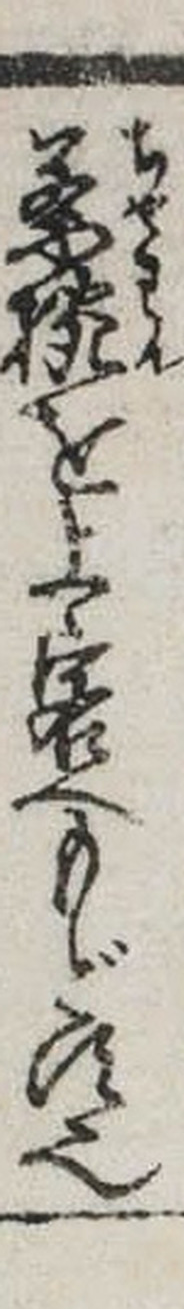茶椀を上客へもどす也
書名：頭書萬用婦人手紙之文言
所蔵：東京学芸大学教育コンテンツアーカイブ
